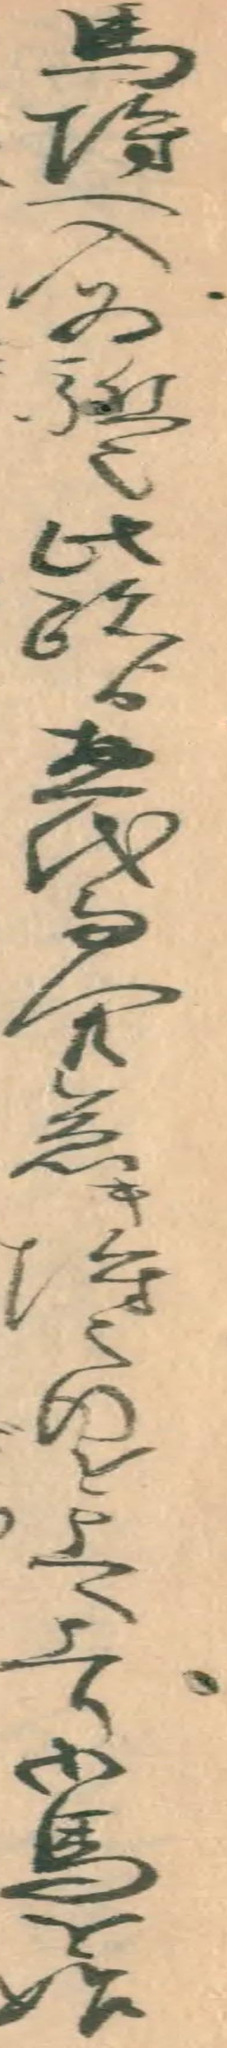馬埒へ入為駈也此跡ゟ惣代両人共急キ埒之内を上へ上り御馬を始
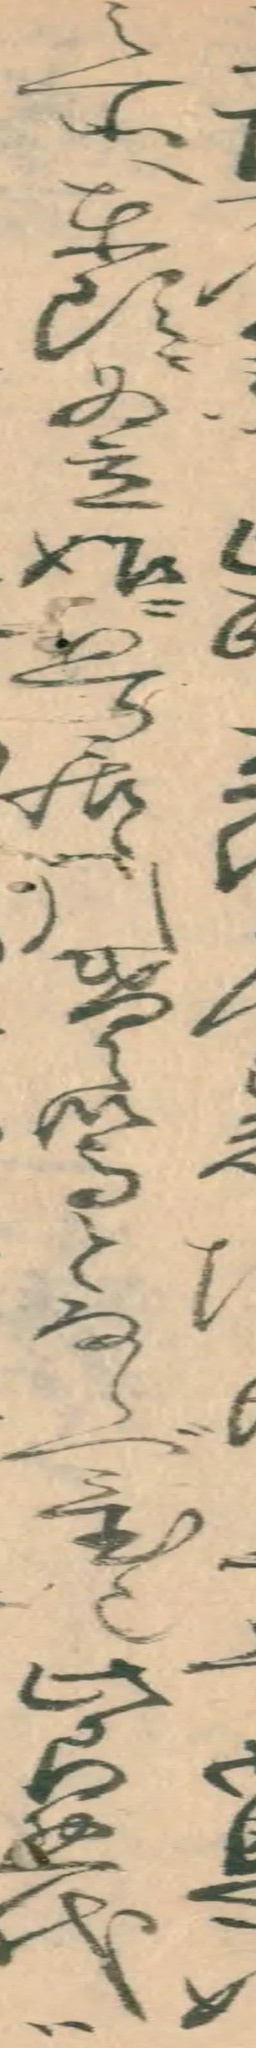之所へ東頭ニ為立始ニ廻り居候引替之御馬とならべ置也此間惣代ハ
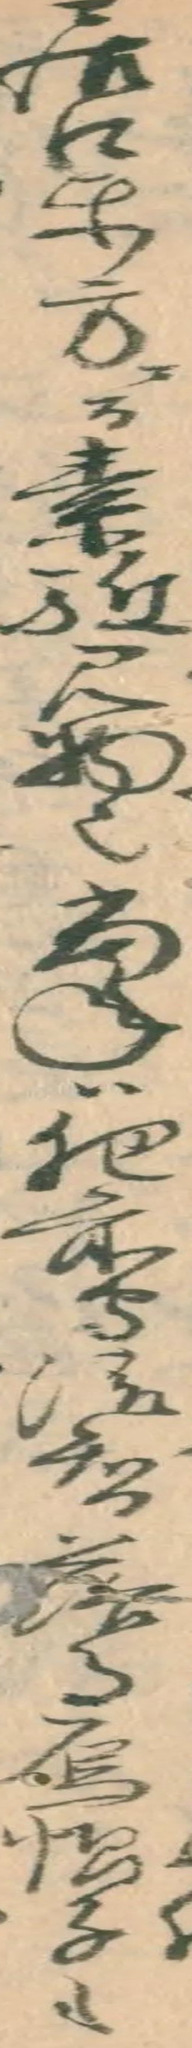居口東方ニ而素駈見物也当年ハ肥前守清智落馬烏帽子も
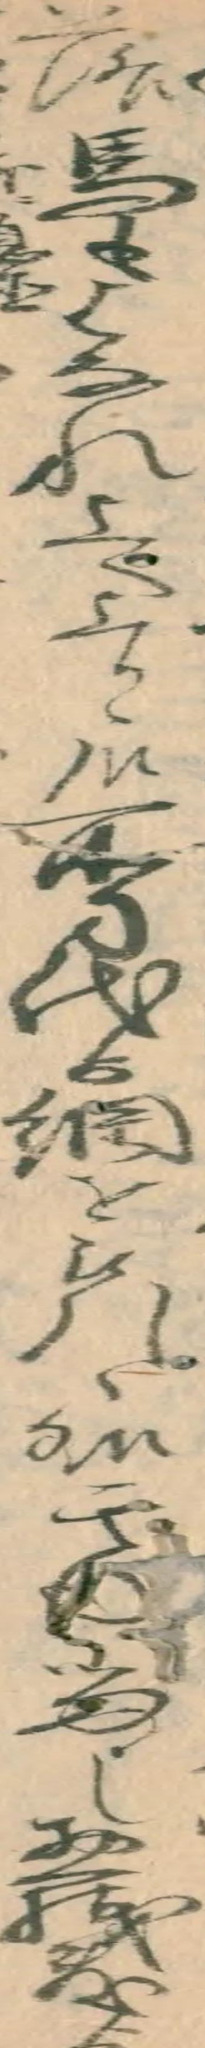落馬もはなれ上へ上り候故所司代ゟ綱を被引候処其内ニ留申候惣桟敷ゟ
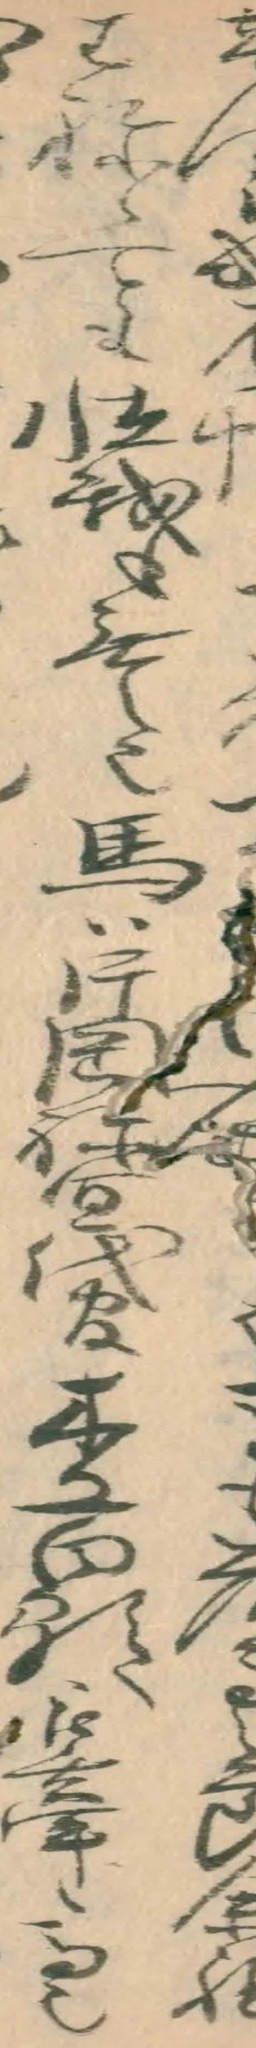はね候へとも怪我も無之也馬ハ片岡祢宜代官木工白顕へ被牽候馬也
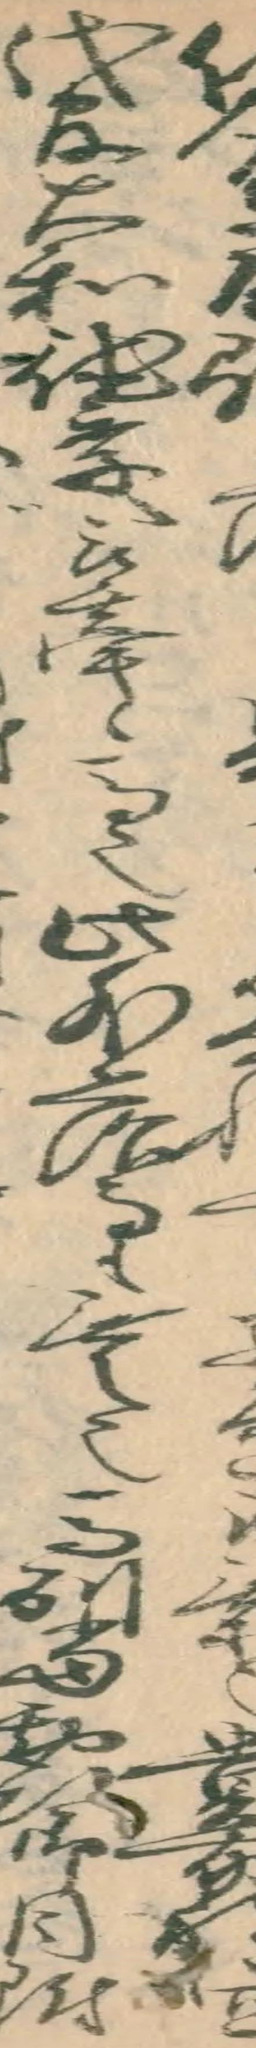代官大和徳季へ被牽候馬也此外落馬も無之也馬別当勘次郎目付
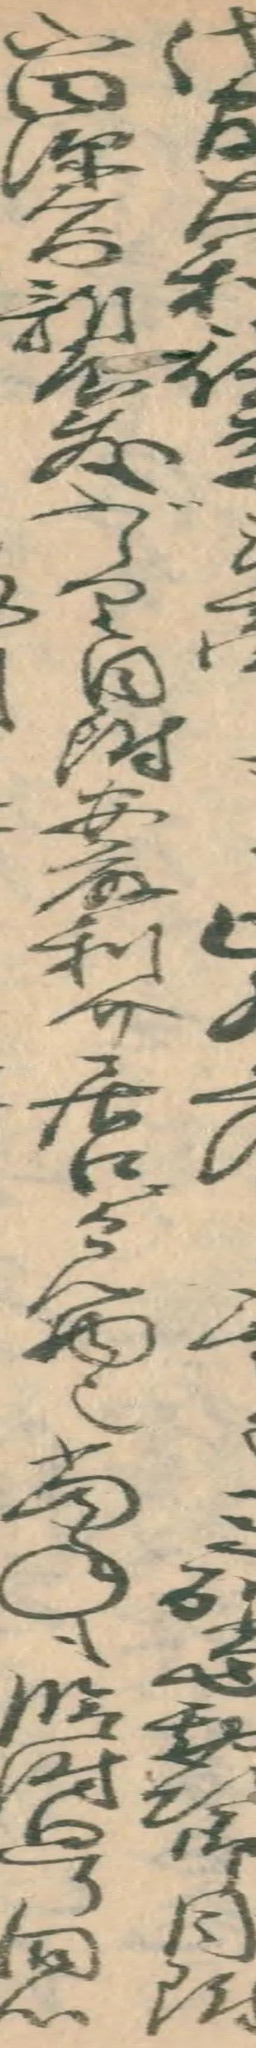山田源右衛門新屋敷ぶしり目付安藤利介居口ニ而見物也当年も臨時廻り同心
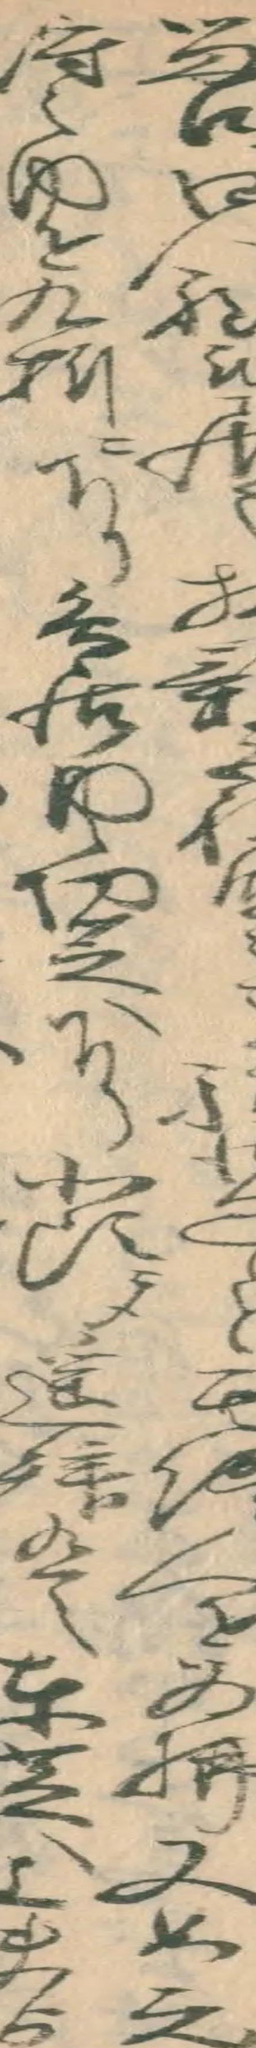埒之内を九折ニ下り鳥居内之切芝へ下り北頭ニ乄遥拝有之東芝へ上夫ゟ
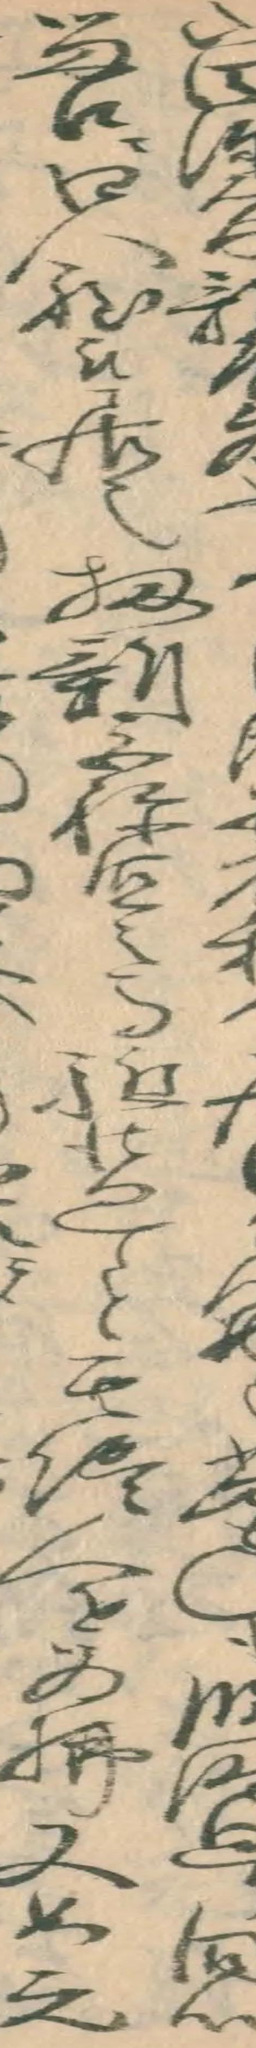留口ニ四人程被居也扨新宮称宜之馬駈仕廻候て其儘人を為払又如元
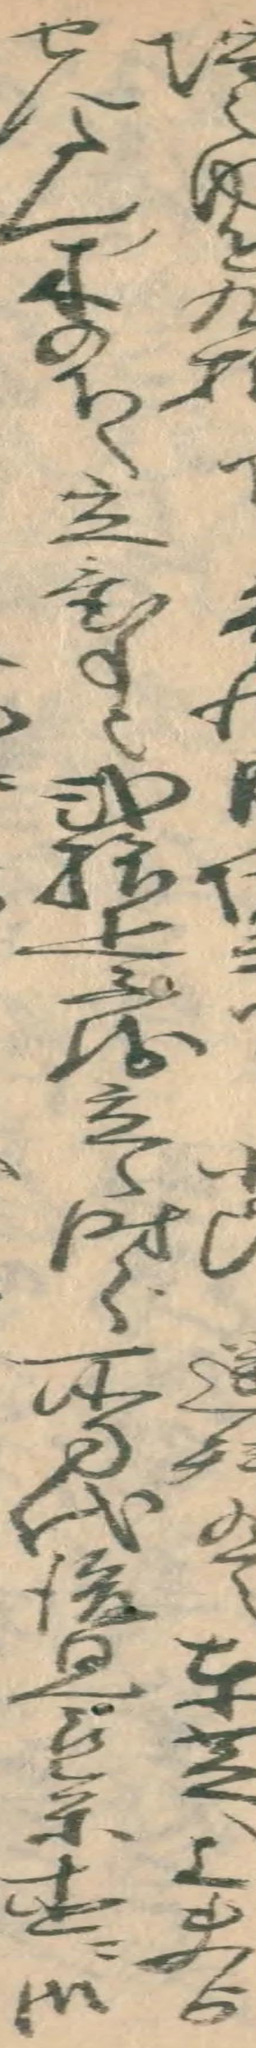せんたんノ木の下へ立置事也弐拾疋不残立候時分所司代後見被参直ニ御
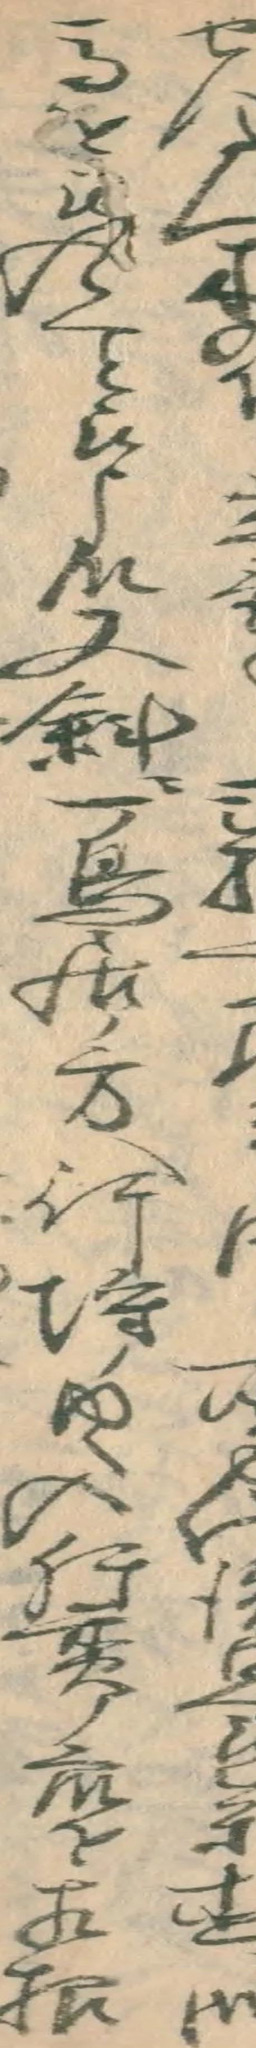馬を被入候へと被申故又斜ニ一ノ鳥居ノ方へ行埒ノ内へ入肝煎ノ衆を相招
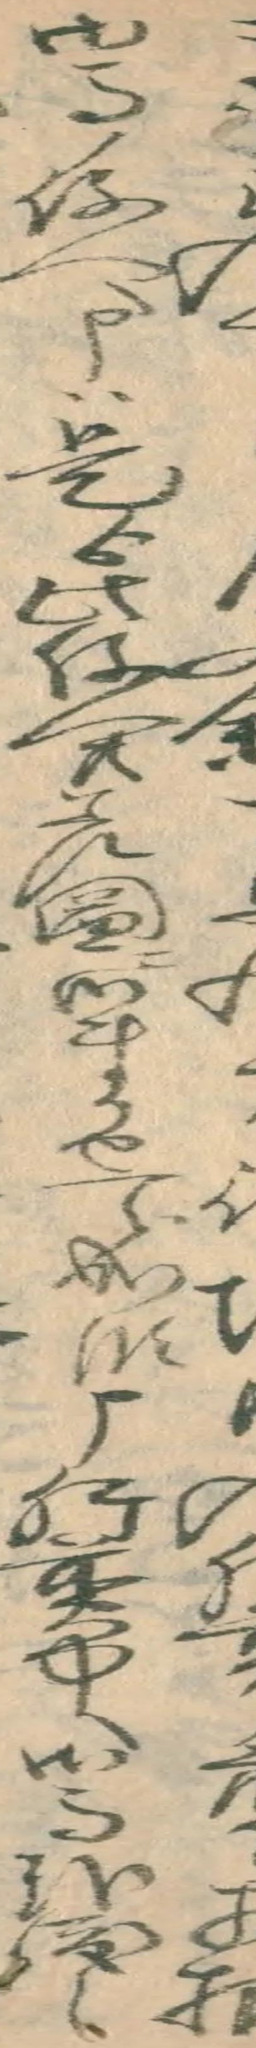御馬ノ役人へ申ハ是ゟ此役人共差図ニ御まかせ可被成段申肝煎中へ御馬を渡し
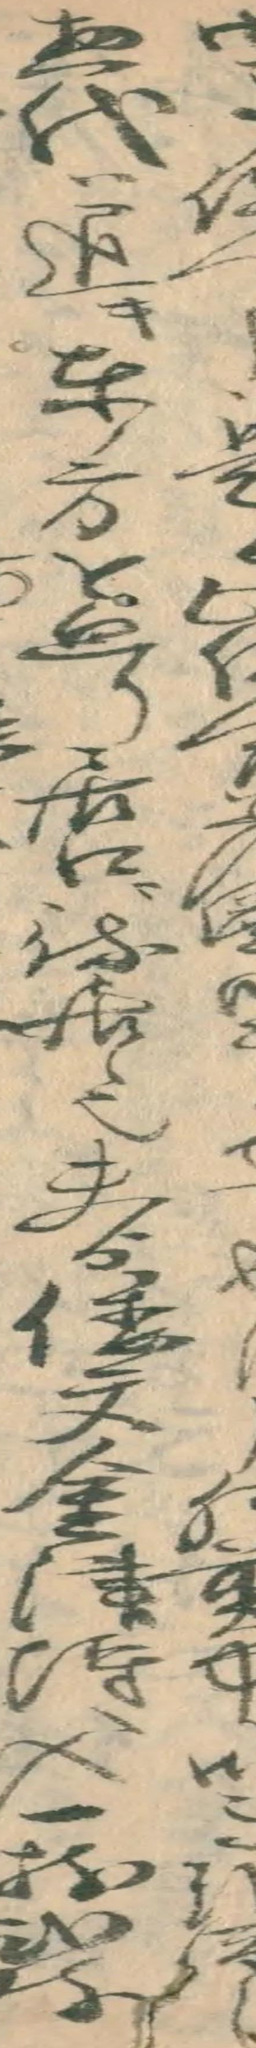惣代ハ退キ東ノ方を廻り居口ニ待居候也夫ゟ倭文金津埒へ入一持弐持
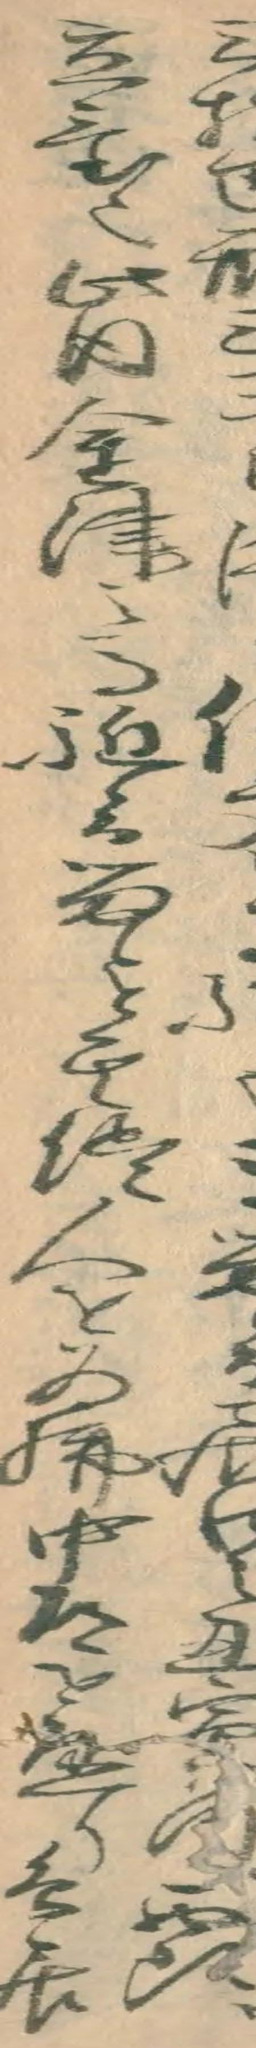立置也此内全津之馬駈候而留候と其侭人を為払中道を通り鳥居

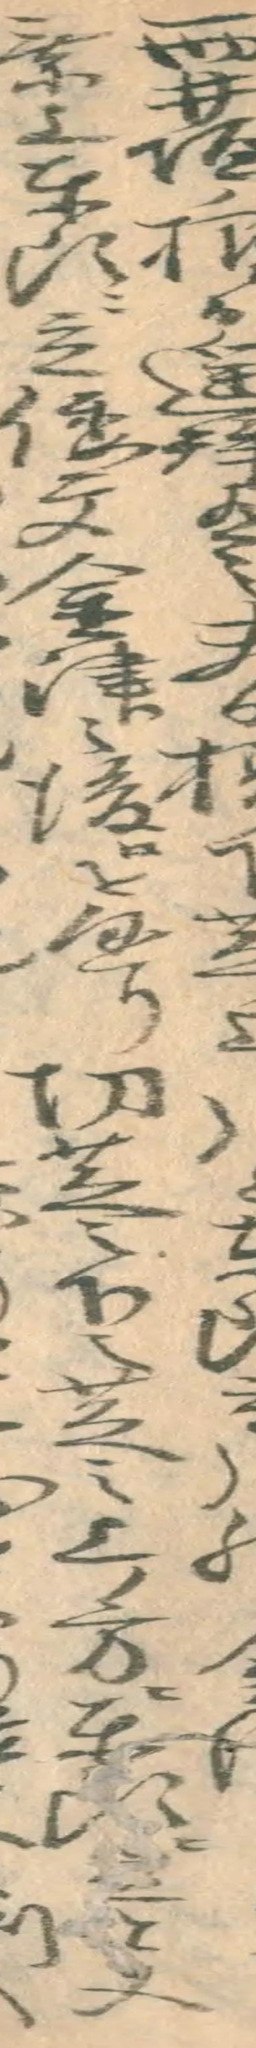乗上東頭ニ立倭文金津之後ロを通り切芝之下之芝之上ノ方ニ東頭ニと又
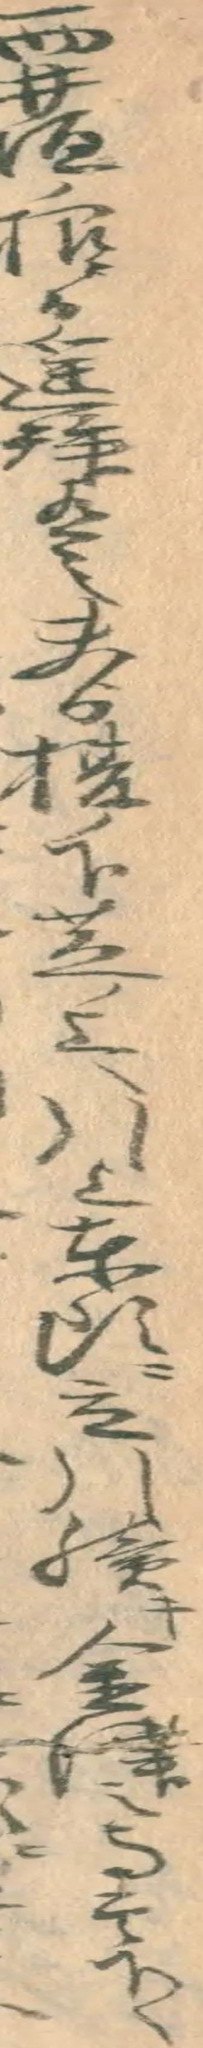西井垣ノ根ニ而遥拝有之夫ゟ榎ノ下芝ノ上へ引上東頭ニ立引続キ金津之馬其下へ
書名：賀茂社記録. 第58冊
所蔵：国立国会図書館 National Diet Library, JAPAN
